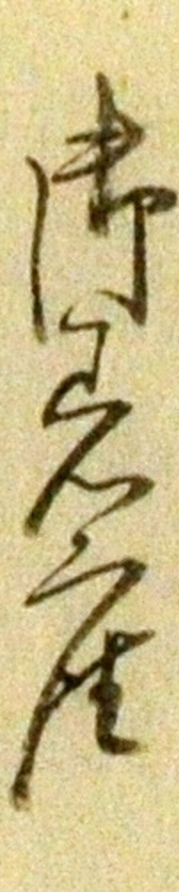御着座
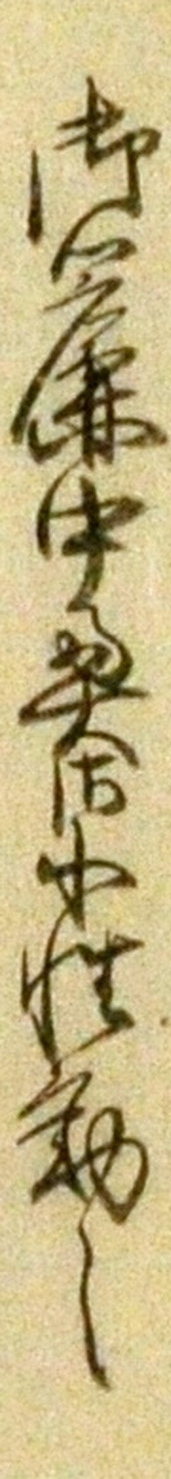御簾中奥御小性勤之
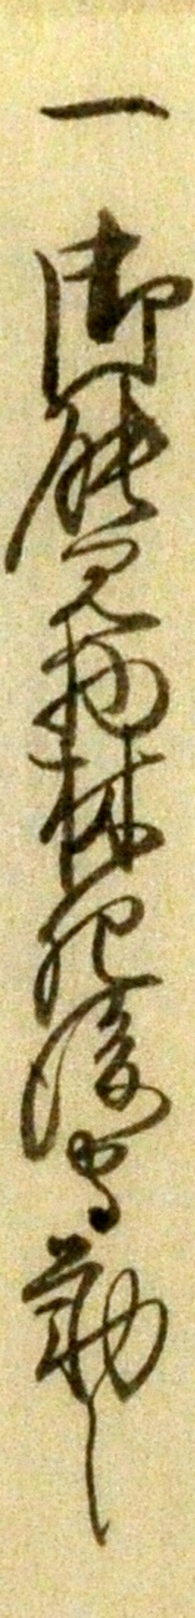一御能見物林肥後守勤之
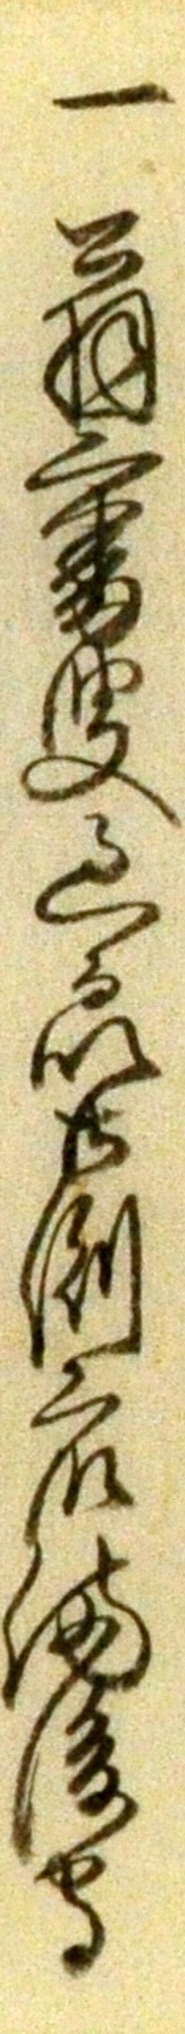一翁三番叟過而以御側衆備後守
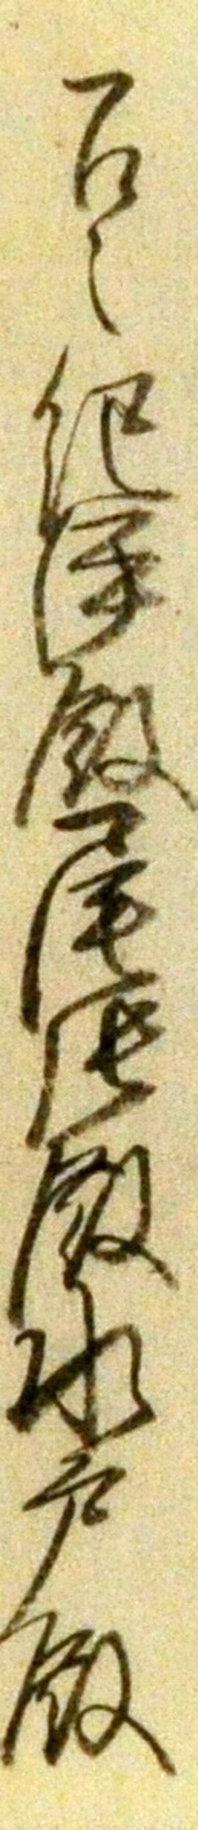召之紀伊殿尾張殿水戸殿
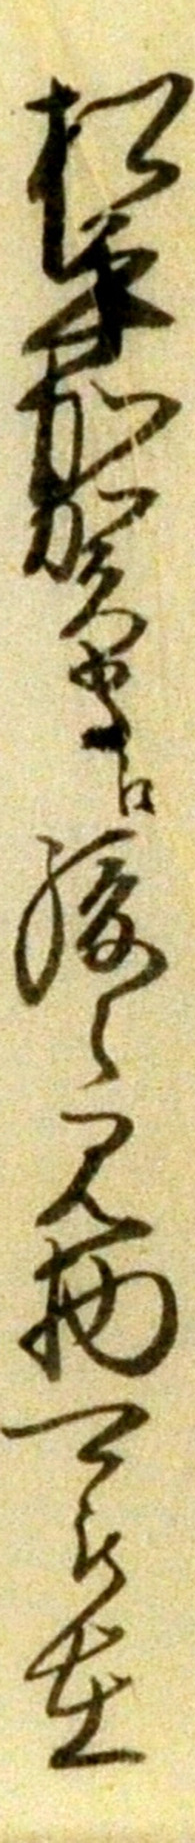松平加賀守え緩々見物可被在
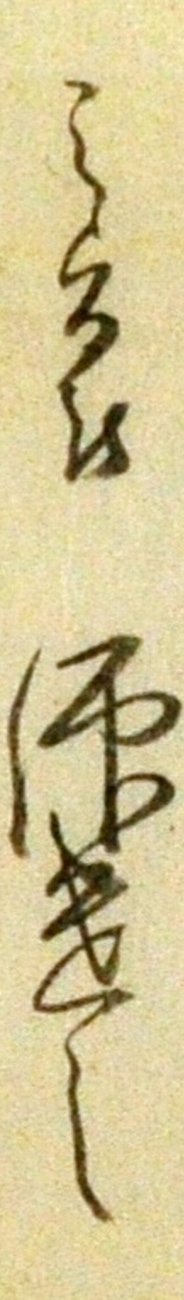之旨被仰遣之
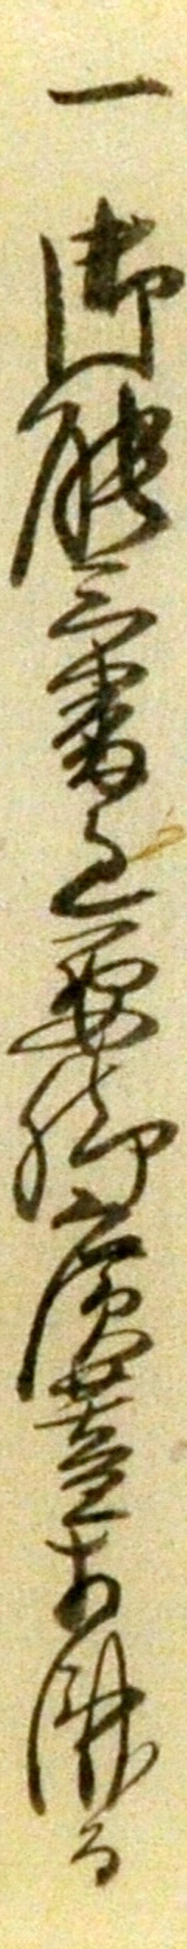一御能三番過要脚広蓋相済而
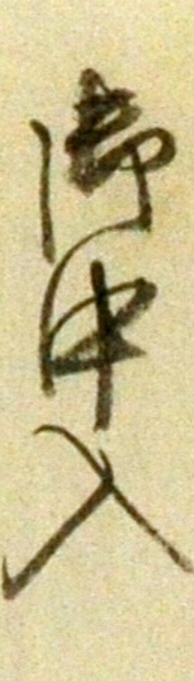御中入

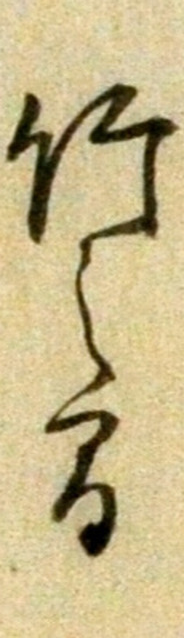竹之間
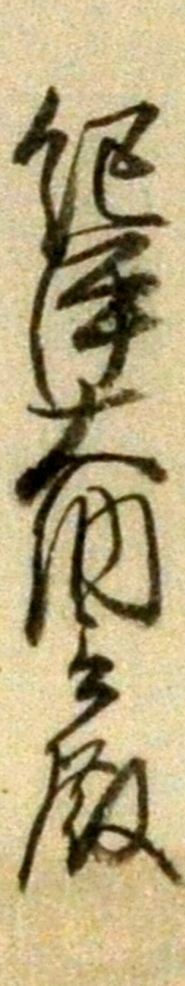紀伊大納言殿
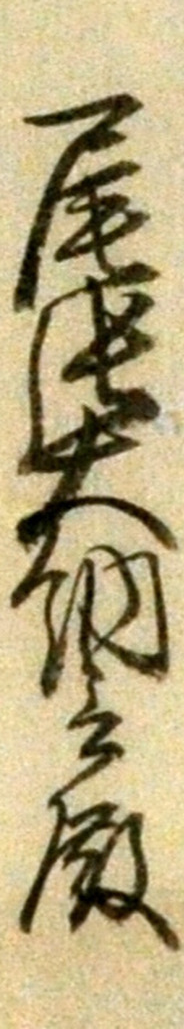紀伊大納言殿
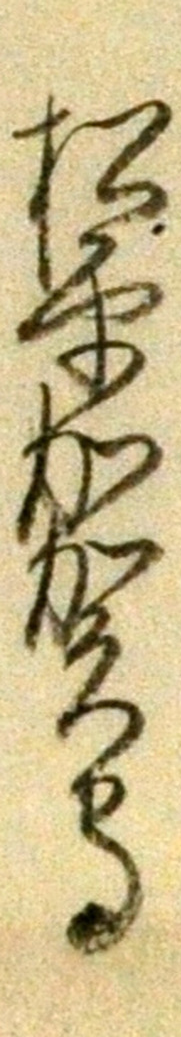松平加賀守
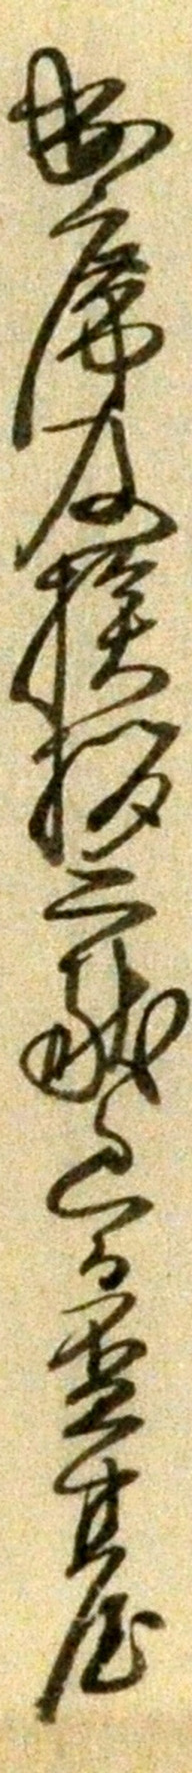出席及挨拶二献過而盃台
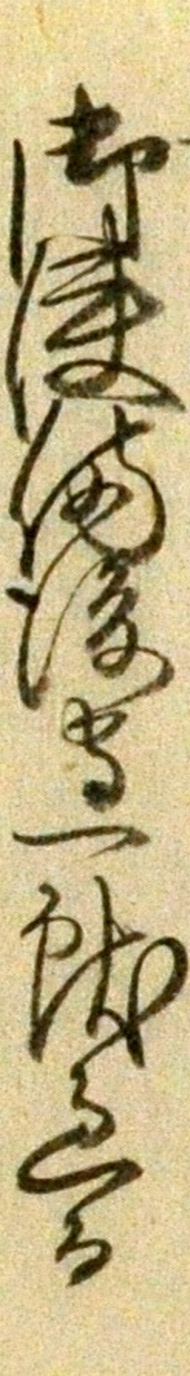御使備後守一献過而
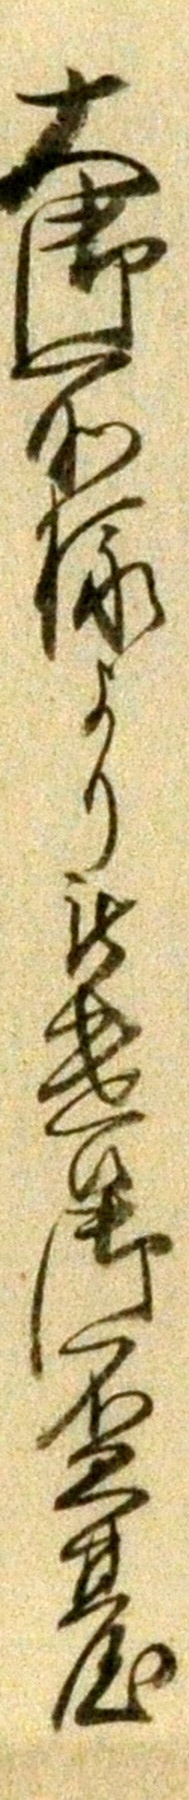大御所様より被遣候御盃台
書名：御馳走御能ノ節ノ留外
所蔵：伊那市立高遠町図書館・合同会社AMANE
